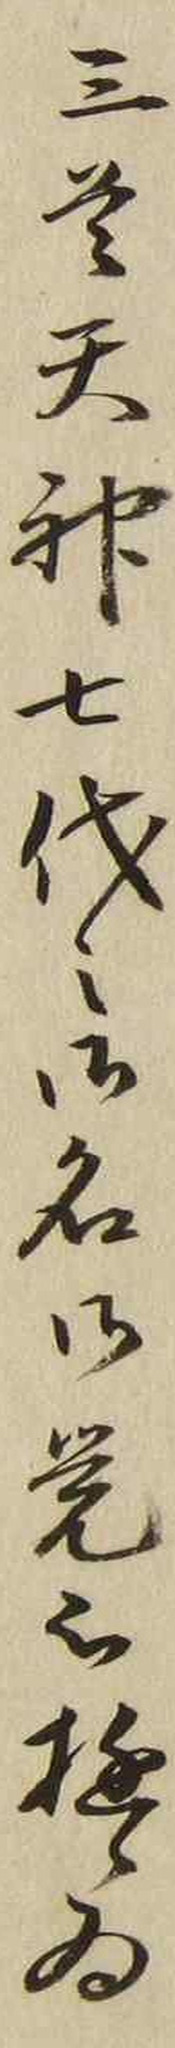三首天神七代之御名御覚被遊候為

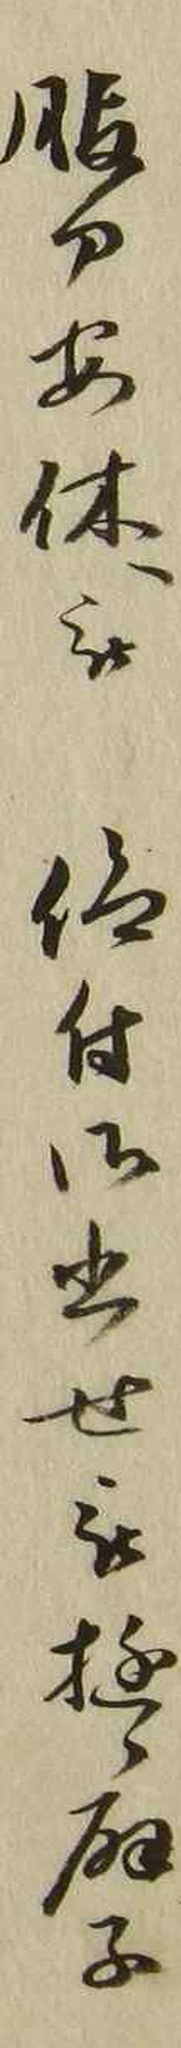服部安休へ被仰付御書せ被遊候扇子
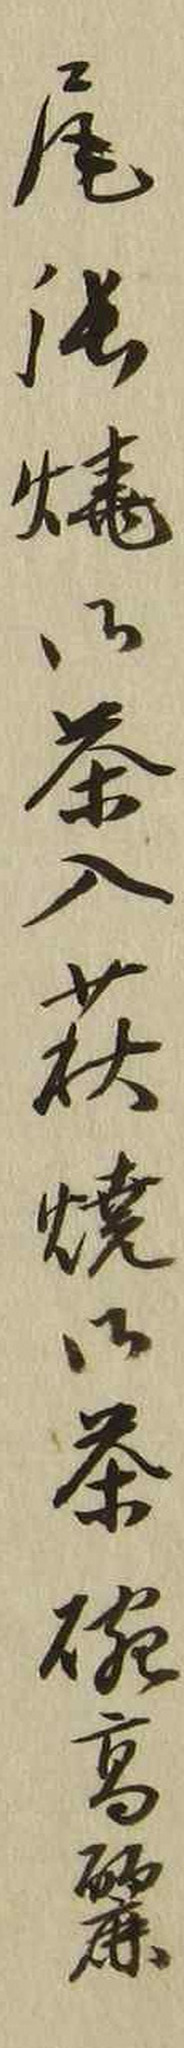尾張焼御茶入萩焼御茶碗高麗
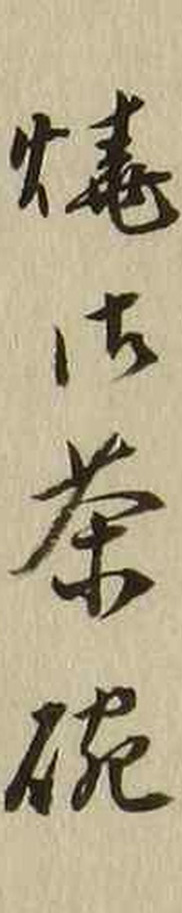焼御茶碗
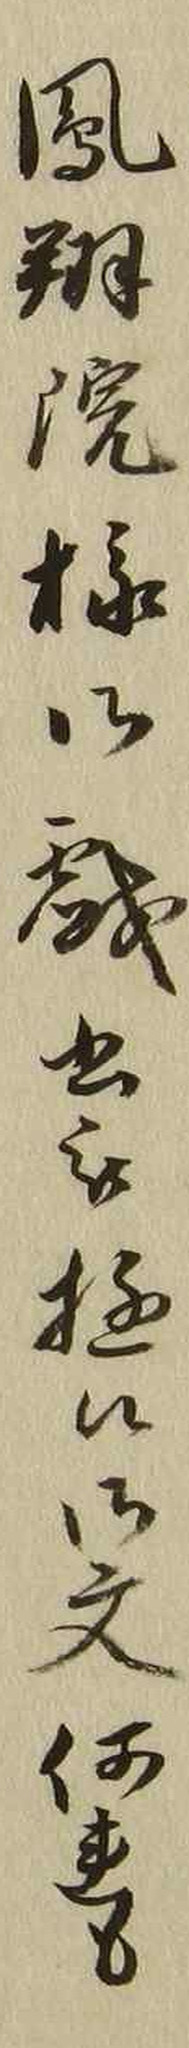鳳翔院様御戯書被遊候御文何れも
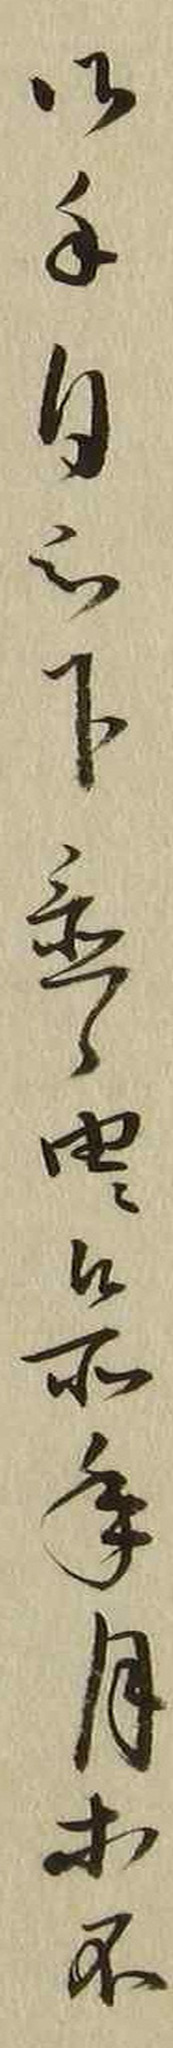御手自被下置候由ニ候所年月等不
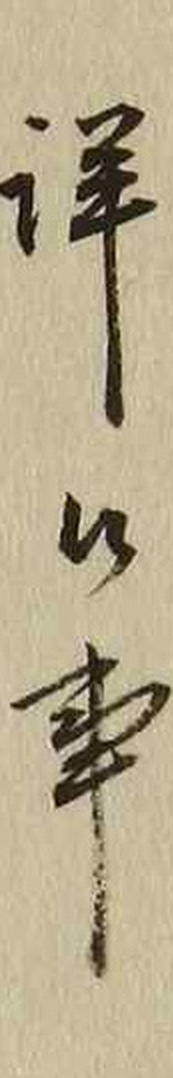詳候事
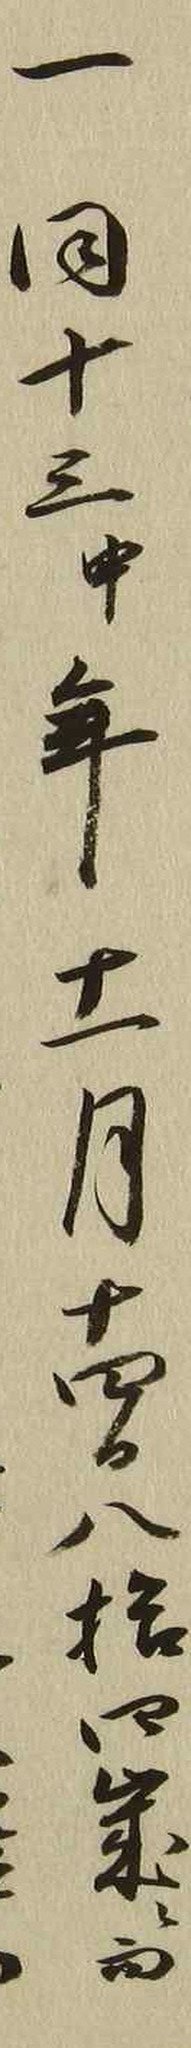一同十三申年十一月十四日八拾四歳ニ而
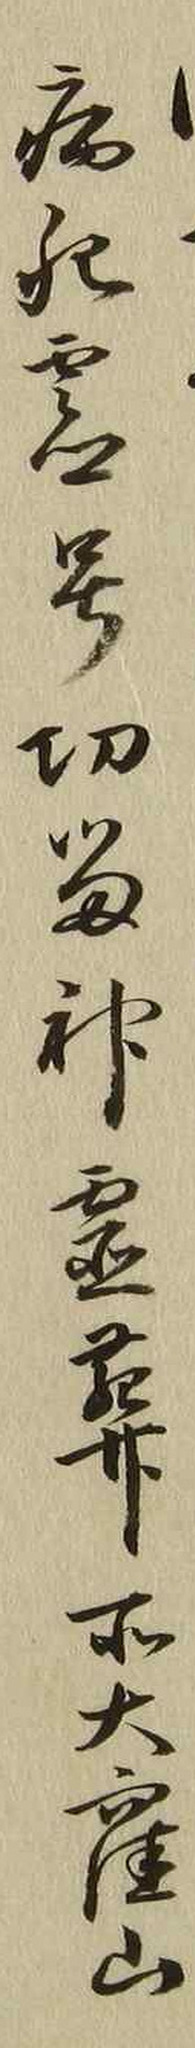病死霊号切留神霊葬所大窪山
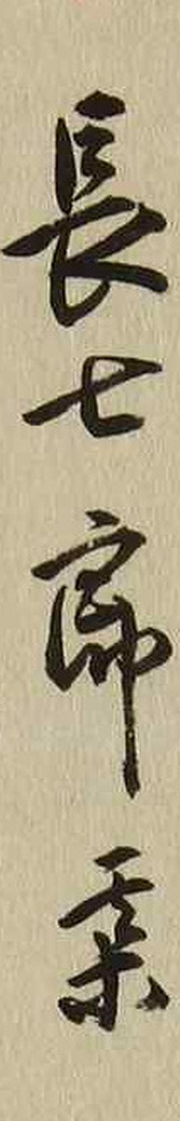長七郎某
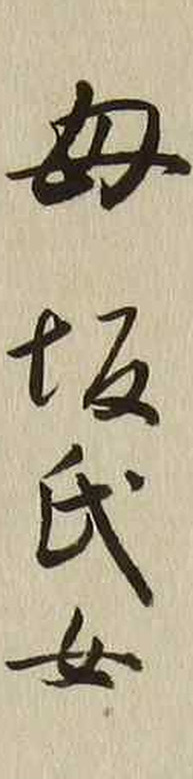母坂氏女
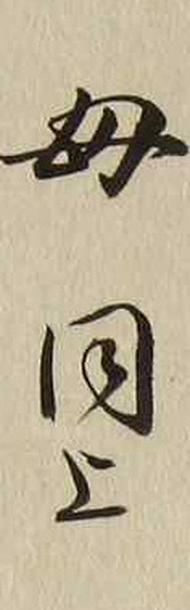母同上
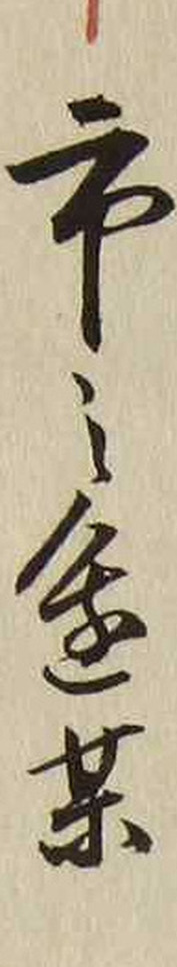市之進某
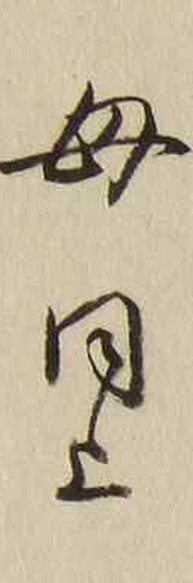母同上

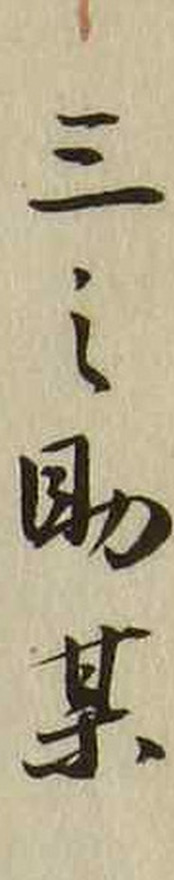三之助某
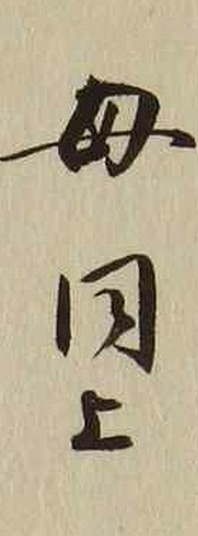母同上
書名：諸士系譜　巻之69　を之部3
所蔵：会津若松市立会津図書館
